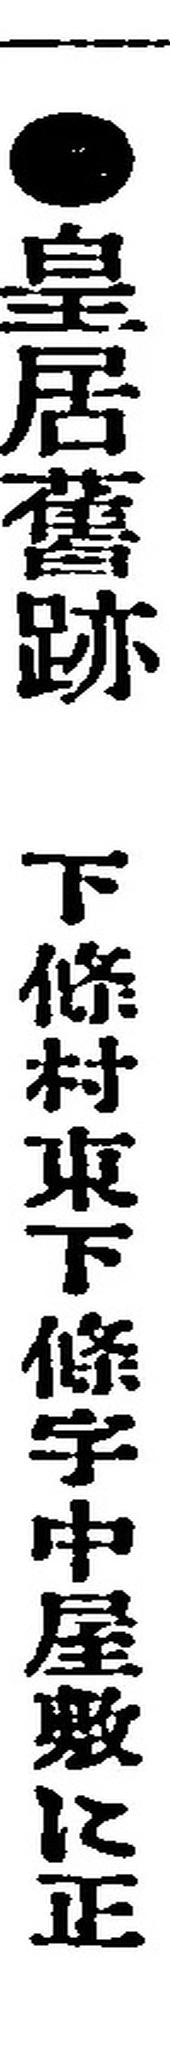●皇居旧跡下條村東下條字中屋敷に正
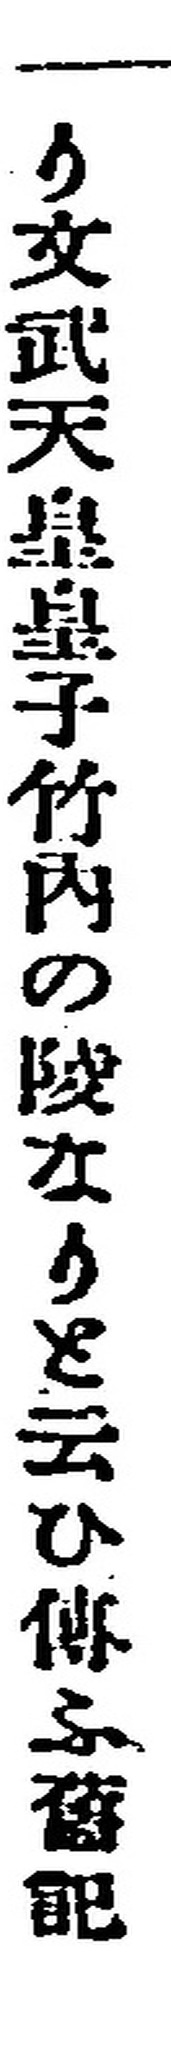り文武天皇皇子竹内の陵なりと云ひ伝ふ旧記
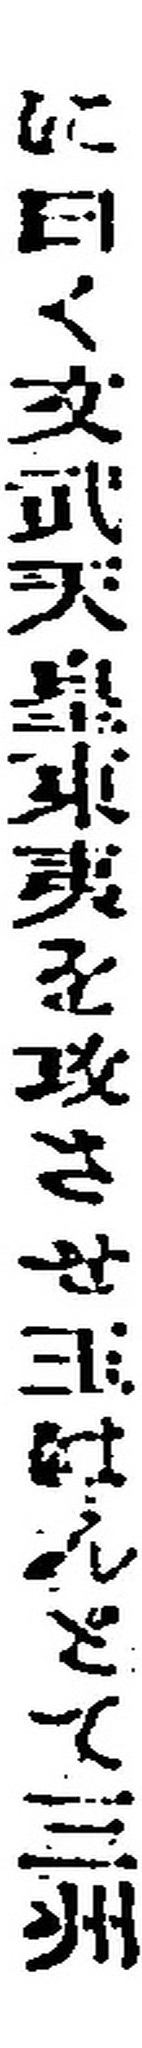に曰く文武天皇東夷を攻させ玉はんとて三州
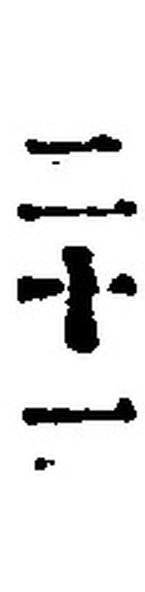二十一

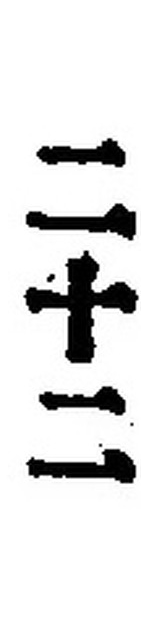二十二
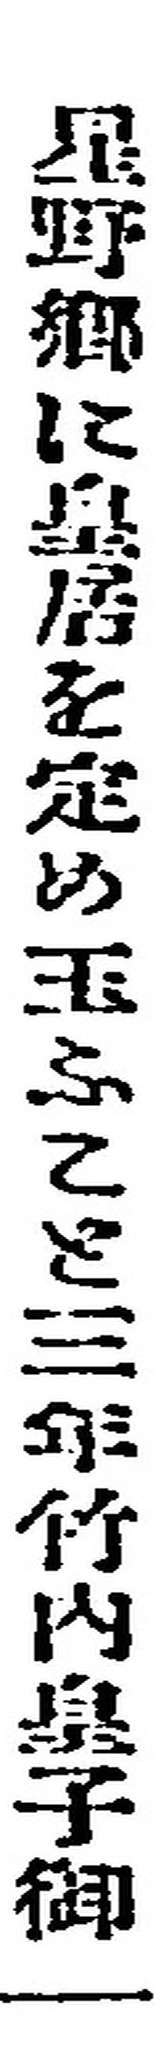星野郷に皇居を定め玉ふこと三年竹内皇子御
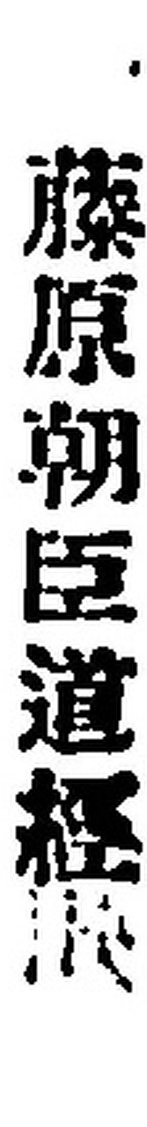仝上藤原朝臣道経
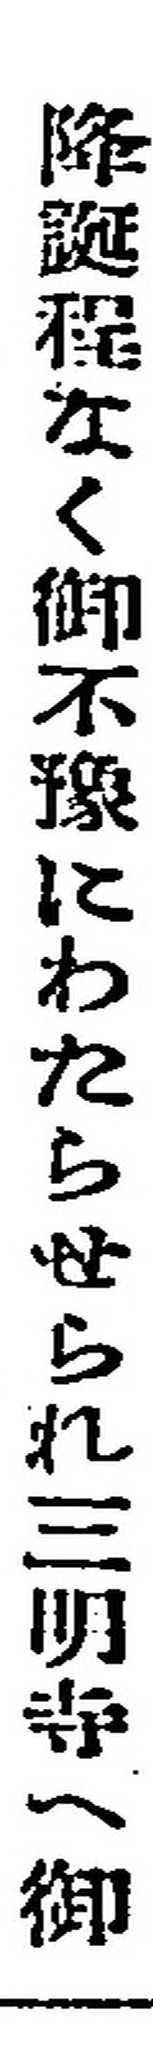降誕程なく御不予にわたらせられ三明寺へ御
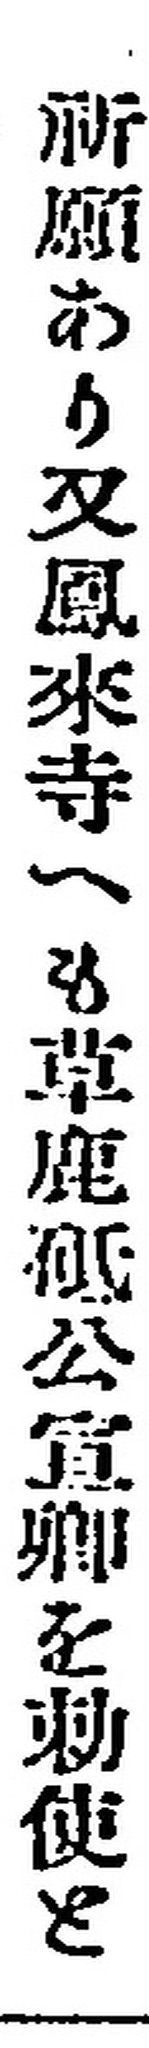祈願あり又鳳来寺へも草鹿砥公宣卿を勅使と
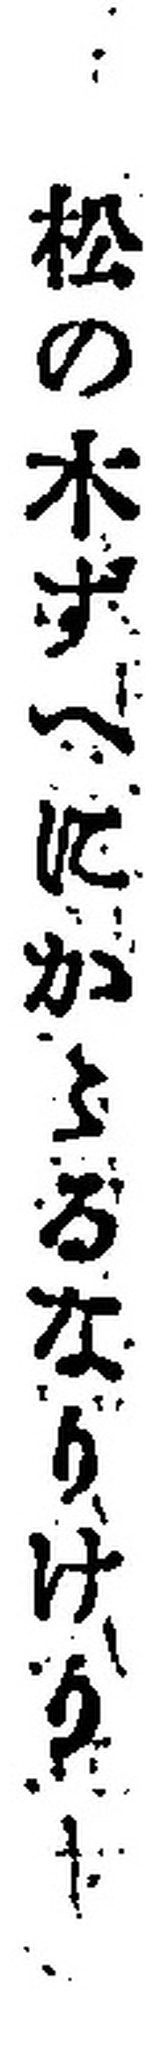松の木ずへにかゝるなりけり
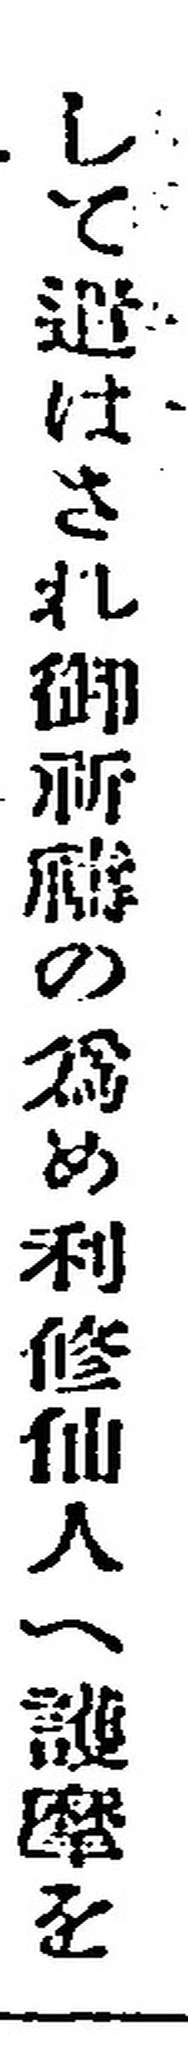して遣はされ御祈祷の為め利修仙人へ護摩を
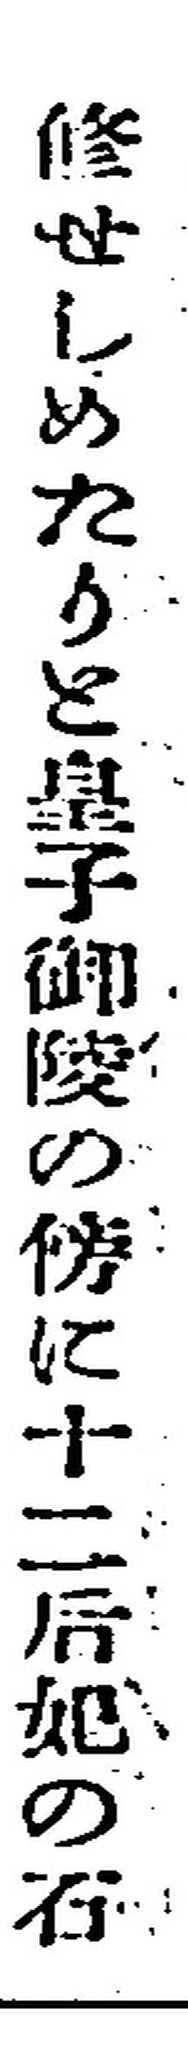修せしめたりと皇子御陵の傍に十二后妃の石
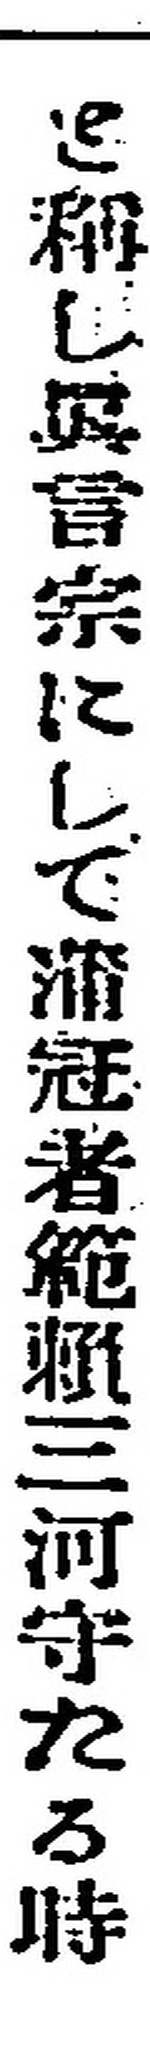と称し真言宗にして蒲冠者範頼三河守たる時
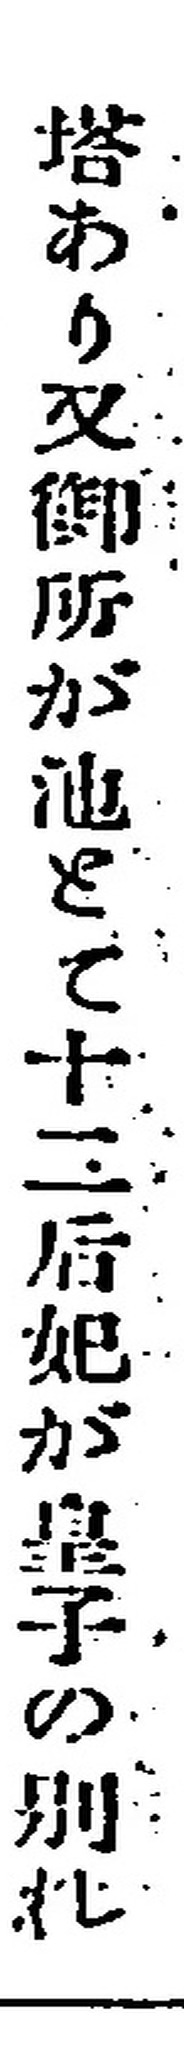塔あり又御所が池とて十二后妃が皇子の別れ
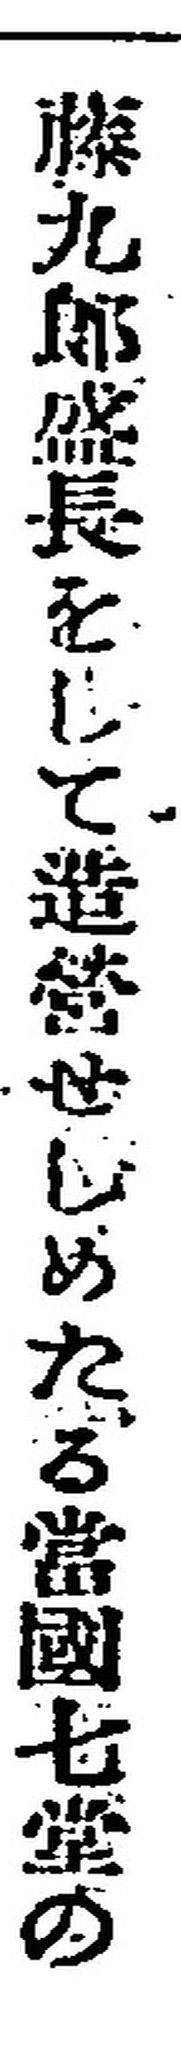藤九郎盛長をして造営せしめたる当国七堂の
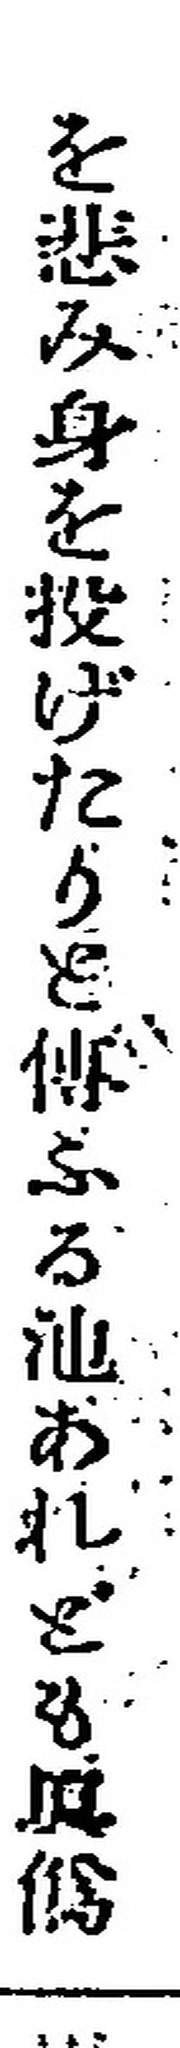を悲め身を投げたりと伝ふる池あれども真偽
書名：東参名勝案内
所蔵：国立国会図書館 National Diet Library, JAPAN
